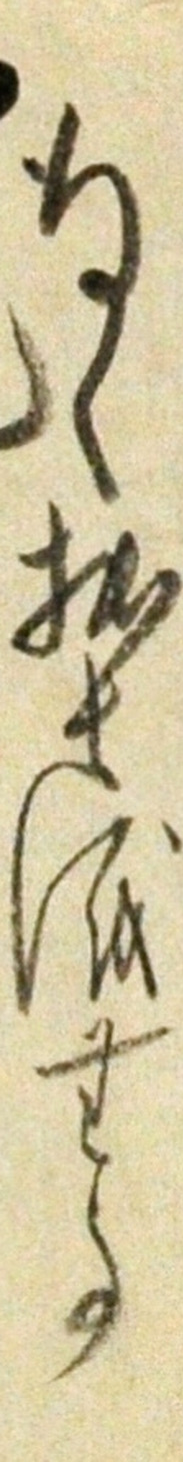存候拙者儀無事
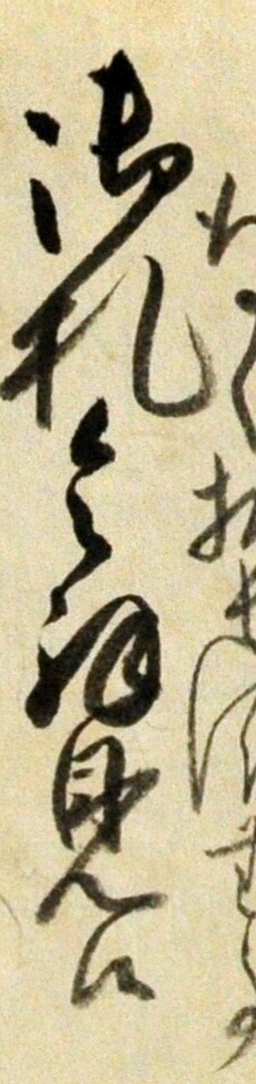御札令拝見候
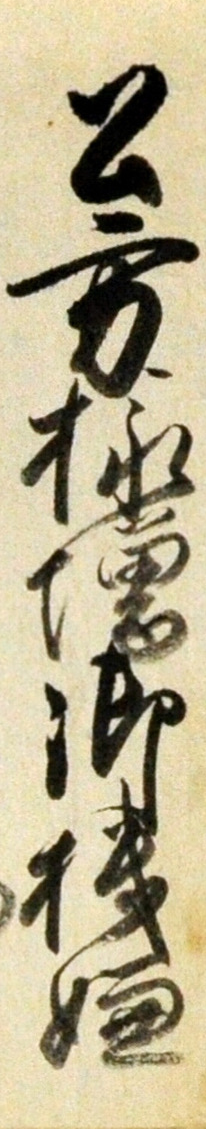公方様増御機嫌
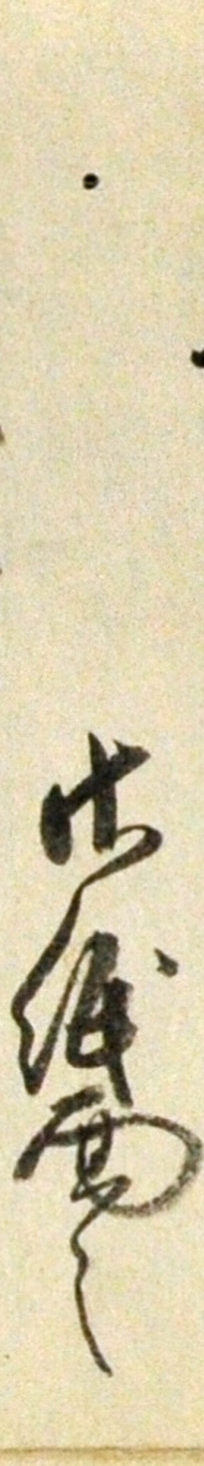御紙面之
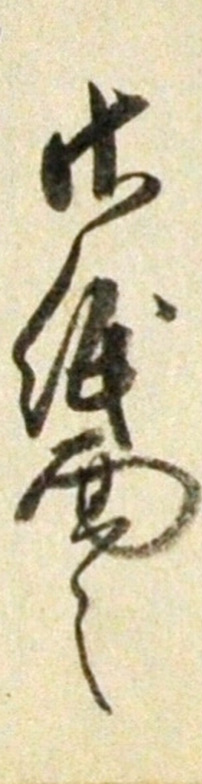御紙面之
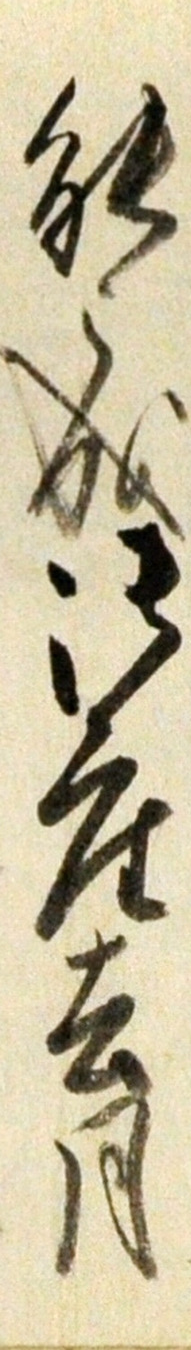能被成御座去月
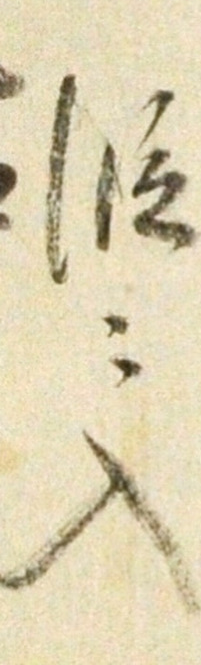條々入
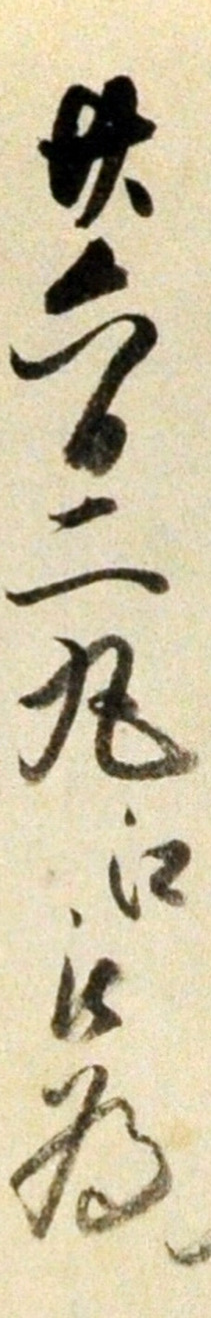廿六日二丸江被為
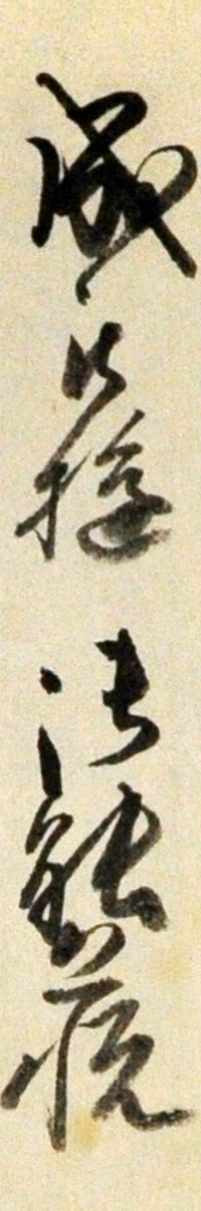成被遊御能恐悦
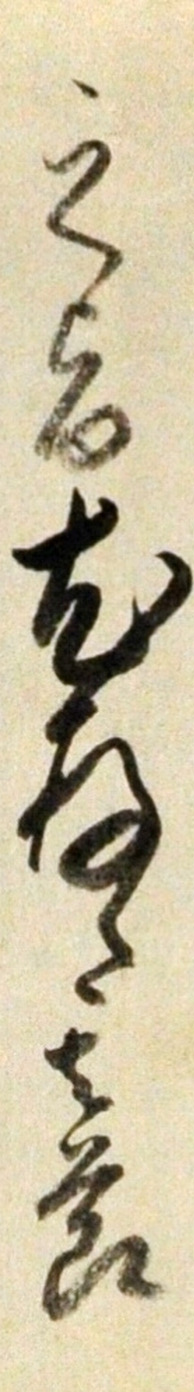之旨尤存候其節
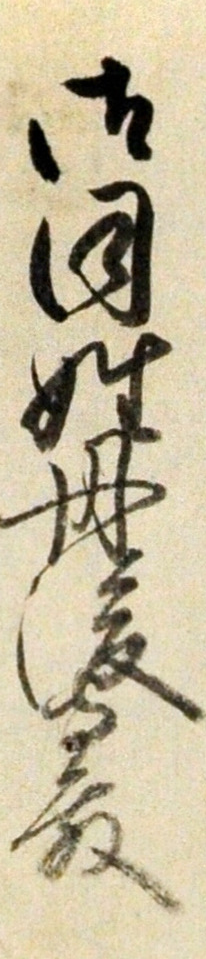御同姓丹後守殿
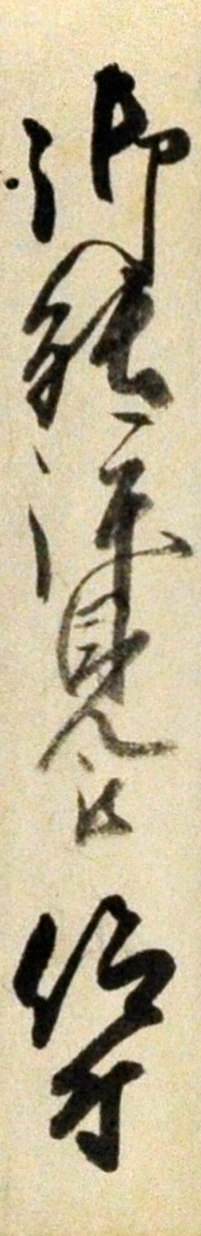御能拝見被仰付
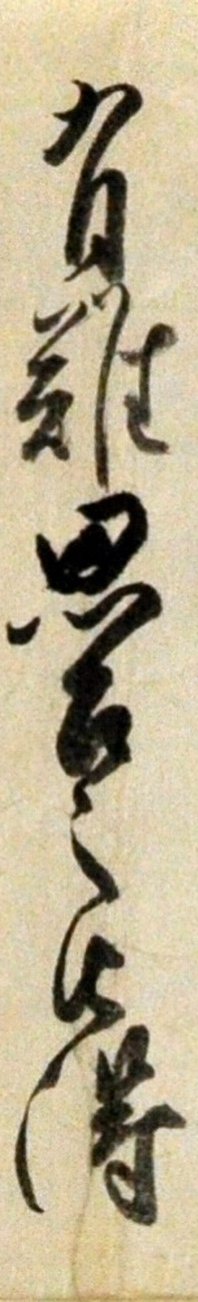有難思召之由得
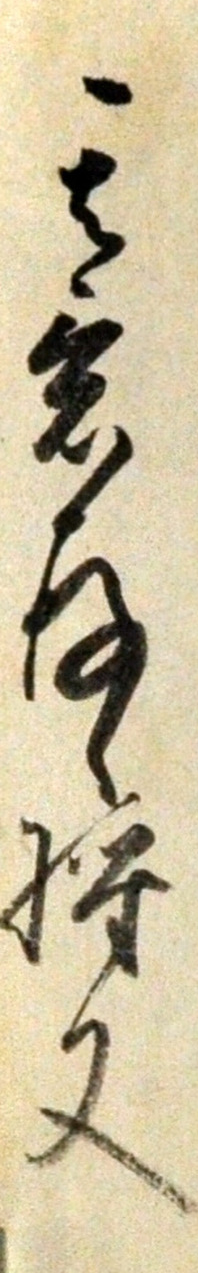其意存候将又
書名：書状
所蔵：伊那市立高遠町図書館・合同会社AMANE
